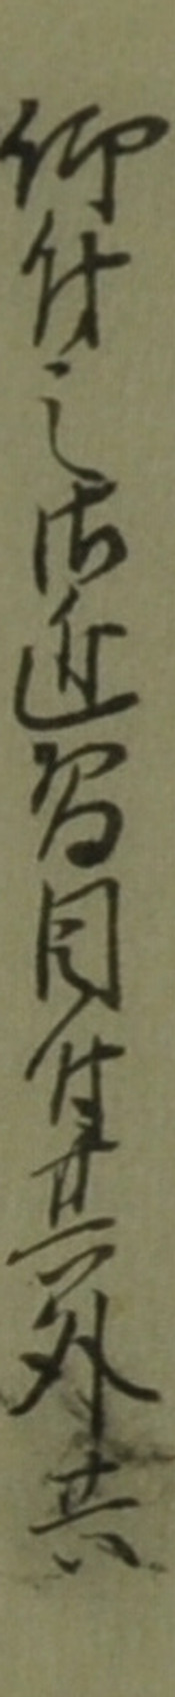仰付之御近習目付其外共
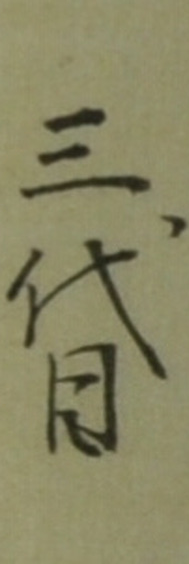三代目

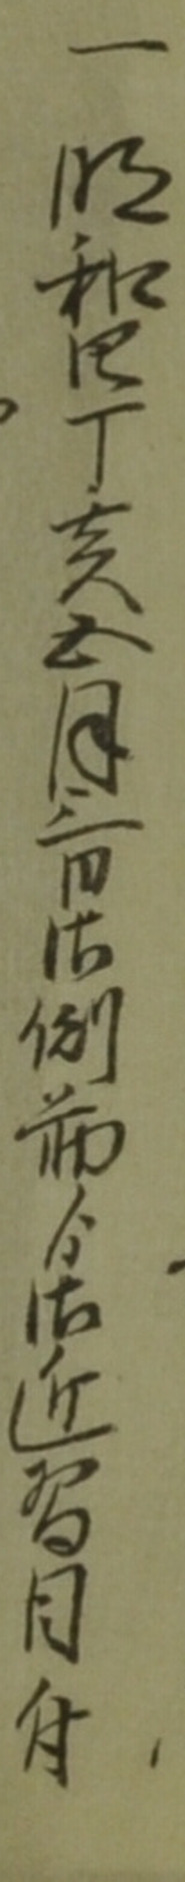一明和四丁亥五月三日御側勤ゟ御近習目付
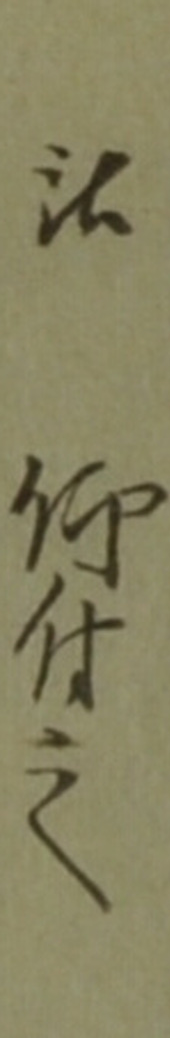被仰付之
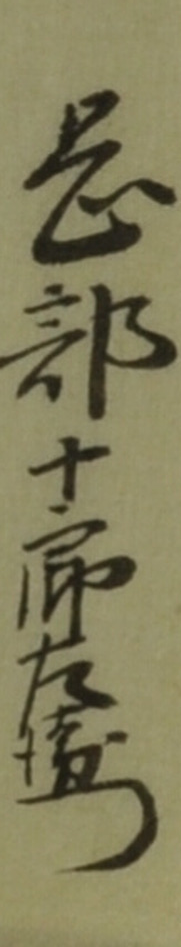岡部十郎左衛門
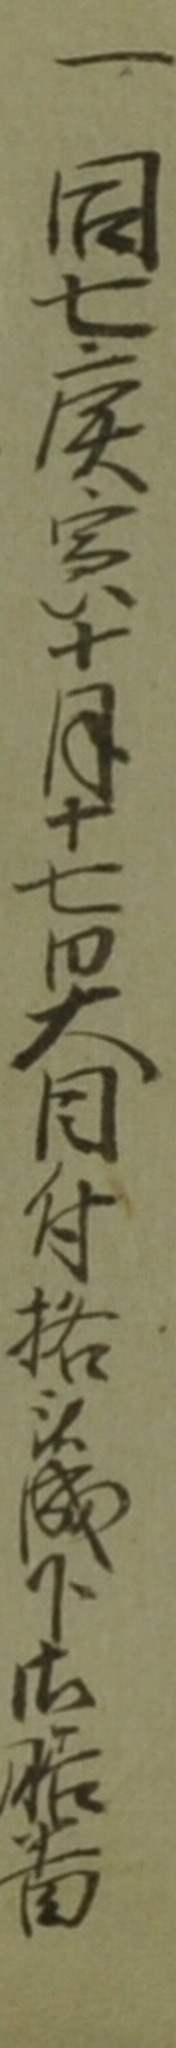一同七庚寅十月十七日大目付格被成下御膳番
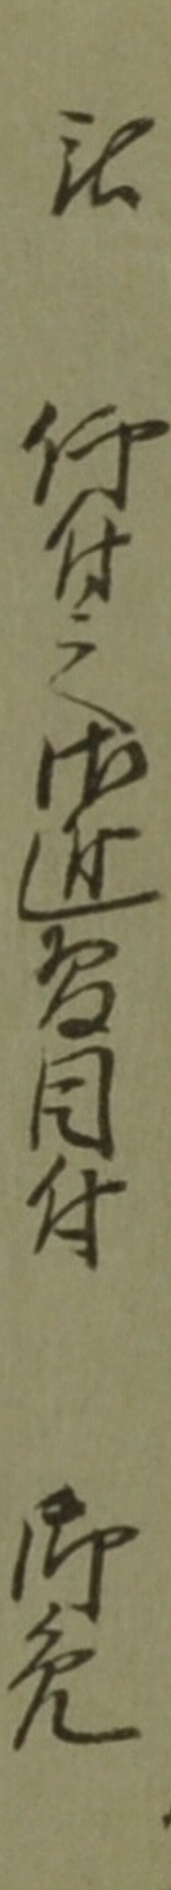被仰付之御近習目付御免
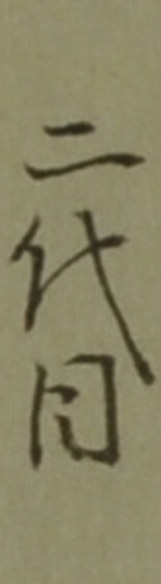二代目
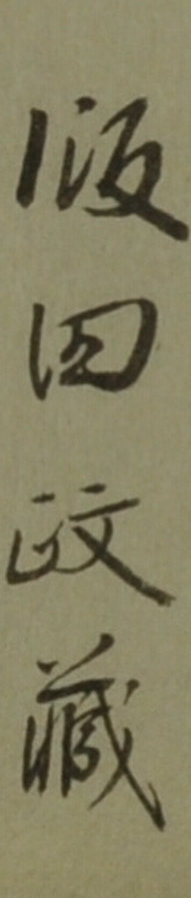飯田政蔵
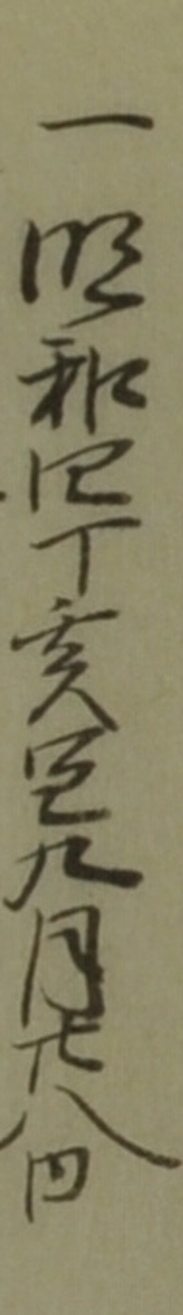一明和四丁亥閏九月廿八日
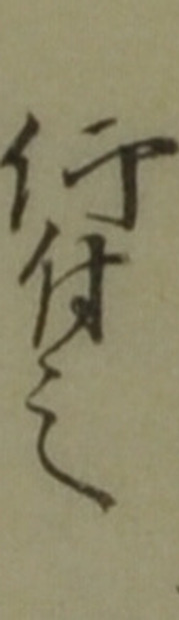仰付之
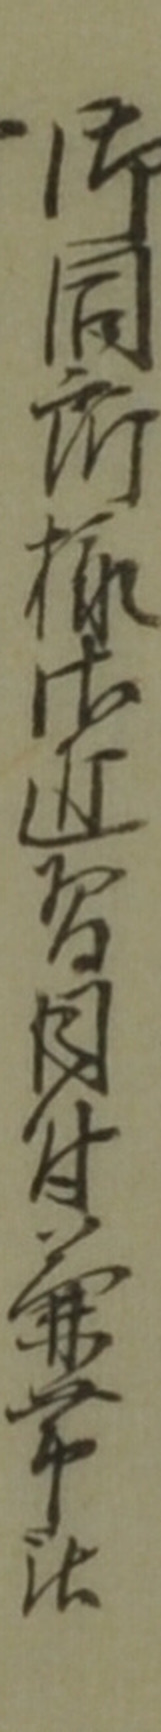御同所様御近習目付兼帯被
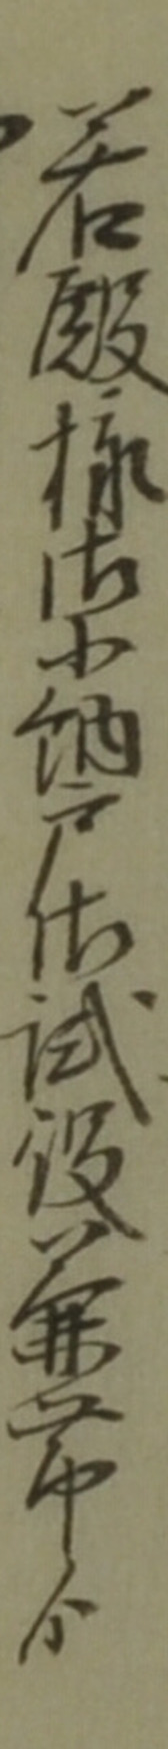若殿様御小納戸御試役兼帯ゟ
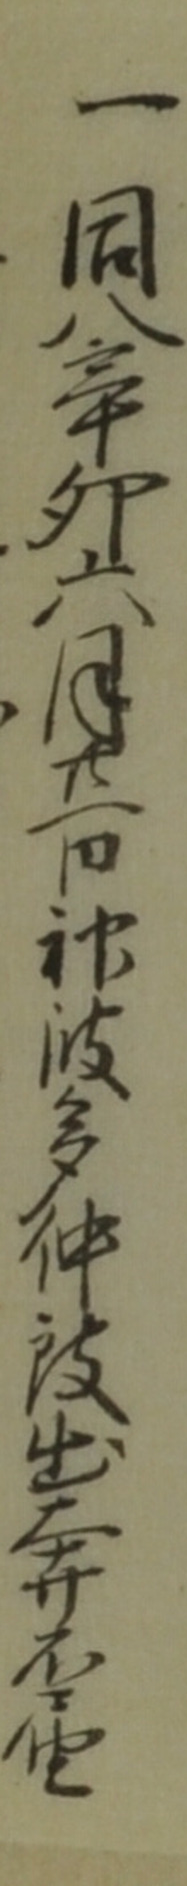一同八辛卯六月廿一日神波多仲致出奔不届
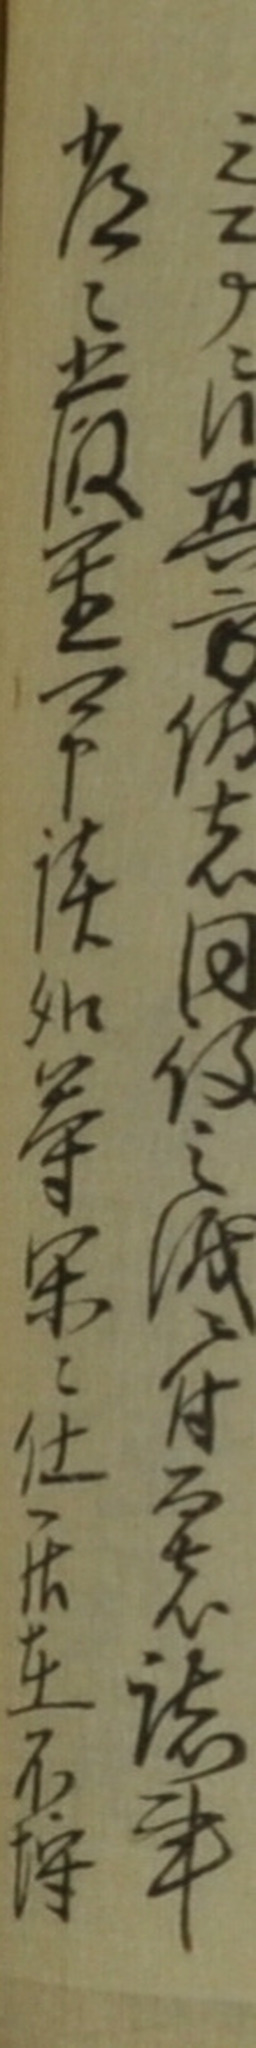常々厳重可申談処等閑ニ仕居在不埒
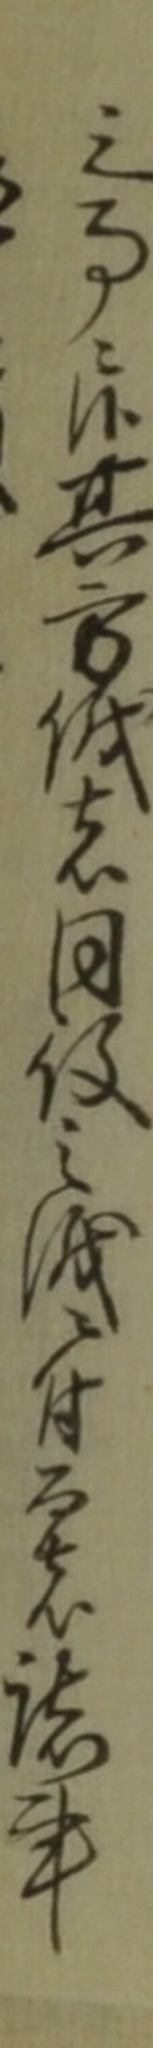之事ニ候其方儀者同役之儀ニ付而者諸事
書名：諸御役代々録（四）
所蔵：伊那市立高遠町図書館・合同会社AMANE
